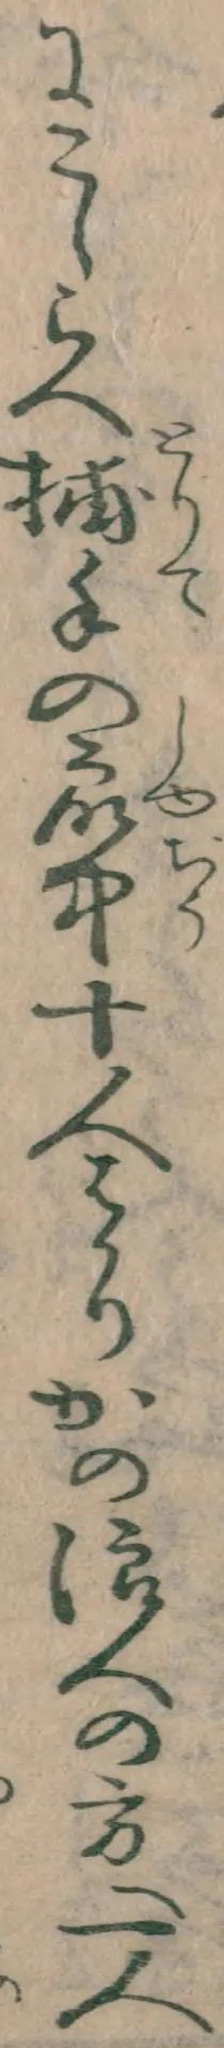にこしらへ捕手の衆中十人はかりかの浪人の方へ一人
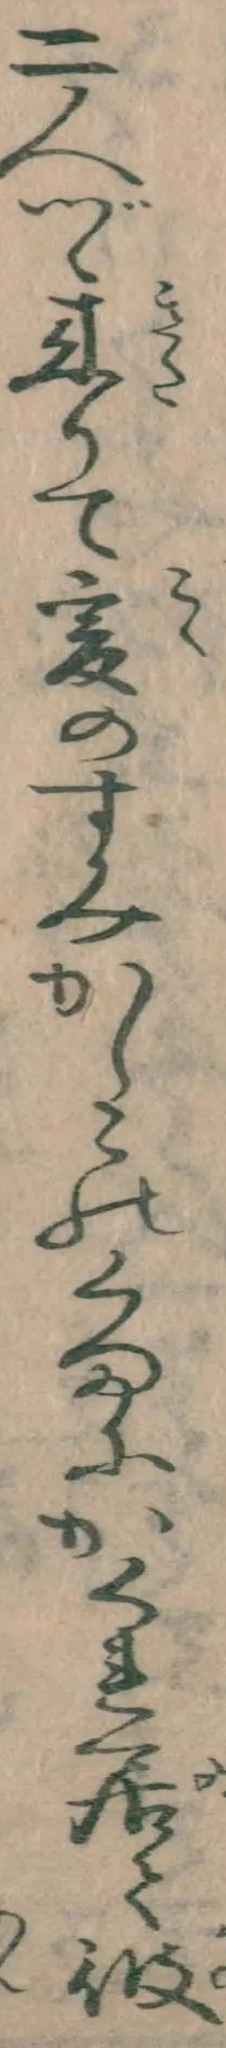二人づゝ来りて爰のすみかしこのくまにかくれ居て彼
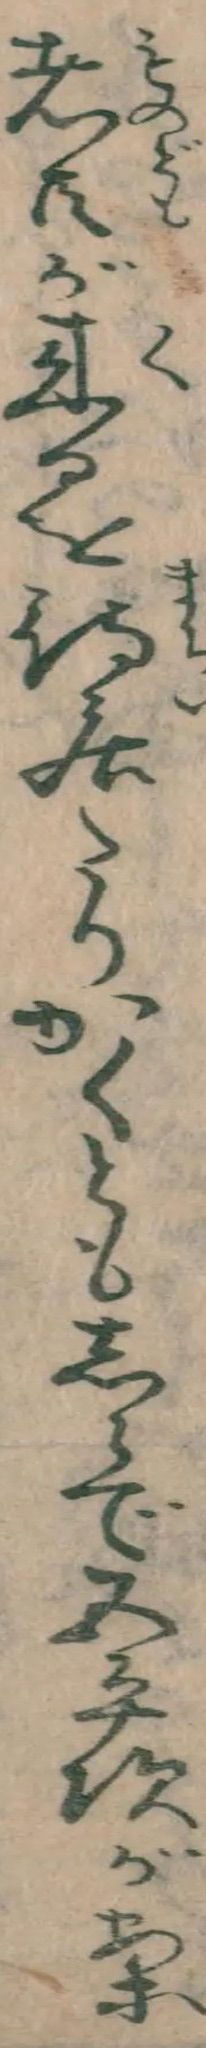者共が来るを待居たりかくともしらで五平次が案
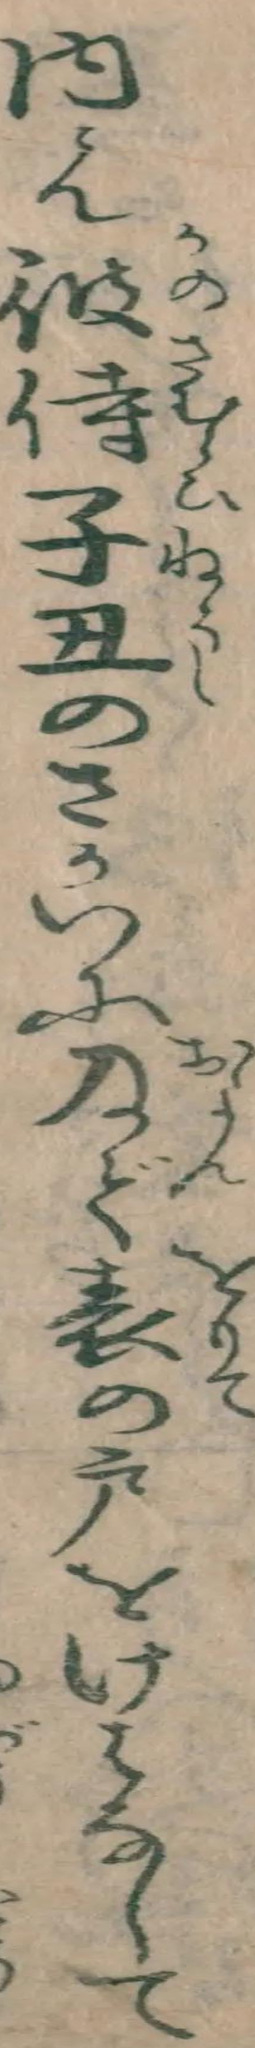内にて彼侍子丑のさかいに及で表の戸をけはなして
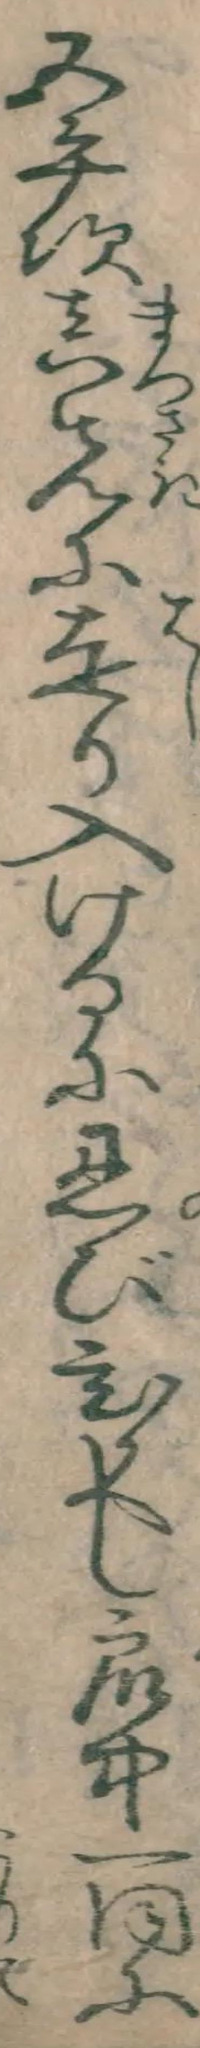五平次真先に走り入けるに忍びひかへし衆中一同に
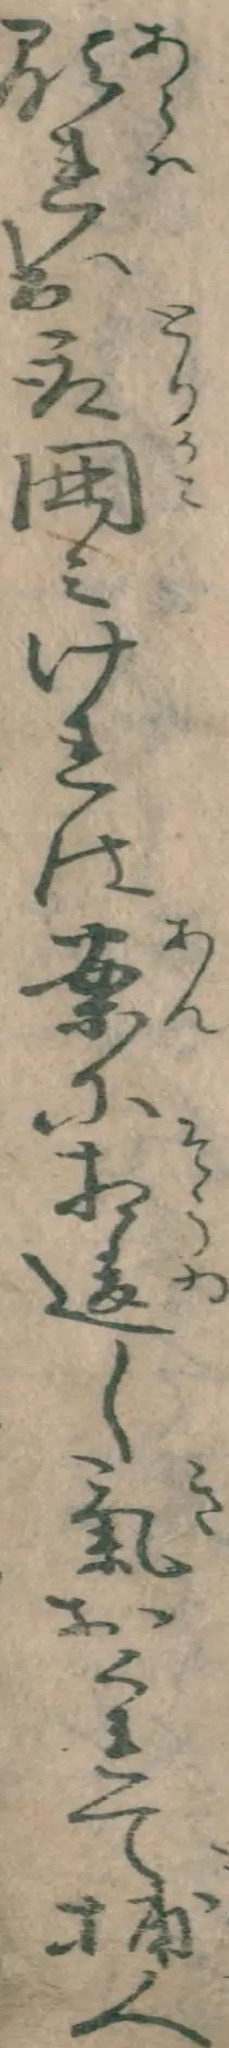顕れ出取囲みけれは案に相違し気おくれて捕人
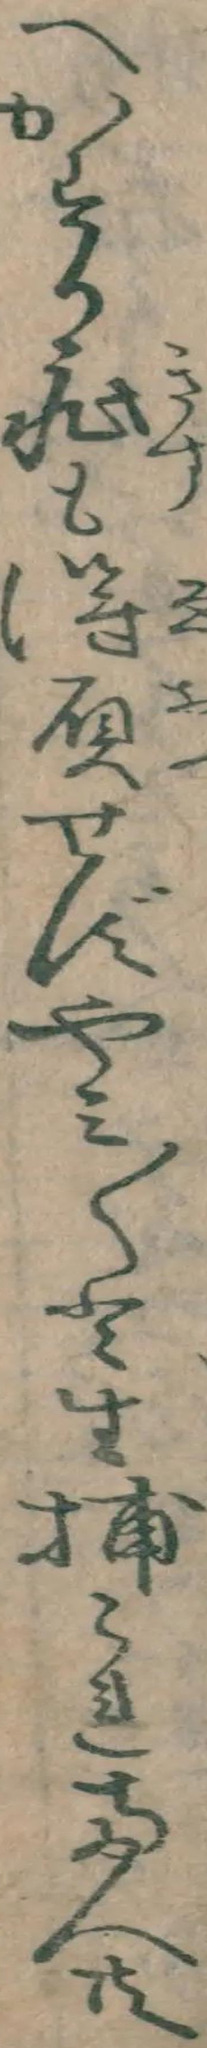へかはり疵も得負せずやみ〳〵と生捕られ両人共

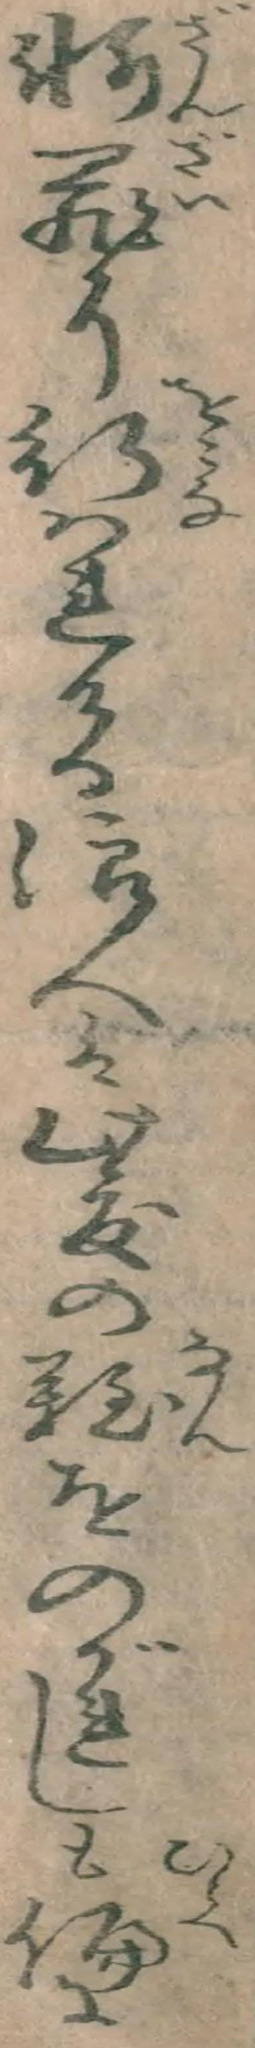斬罪に行はれける浪人は此度の難をのがれしも偏に
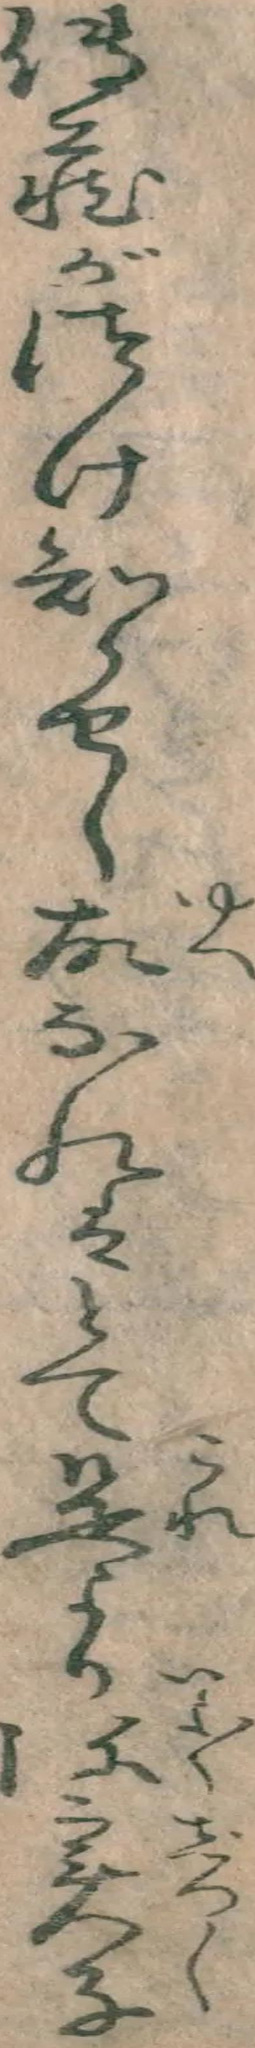伝蔵がつけ知らせし故なれはとて是より弥実子
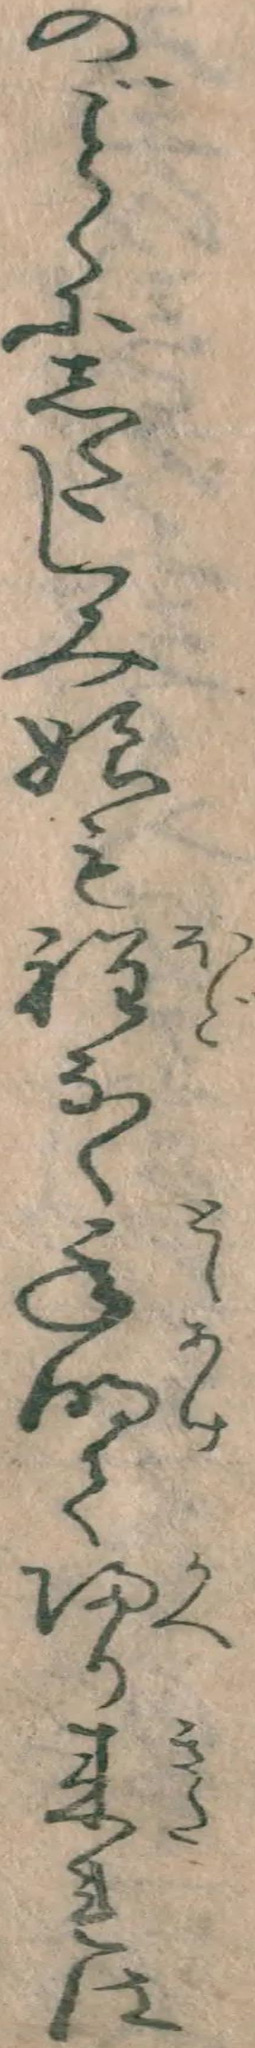のごとくにしたしみ娘も程なく年明て帰り来れは
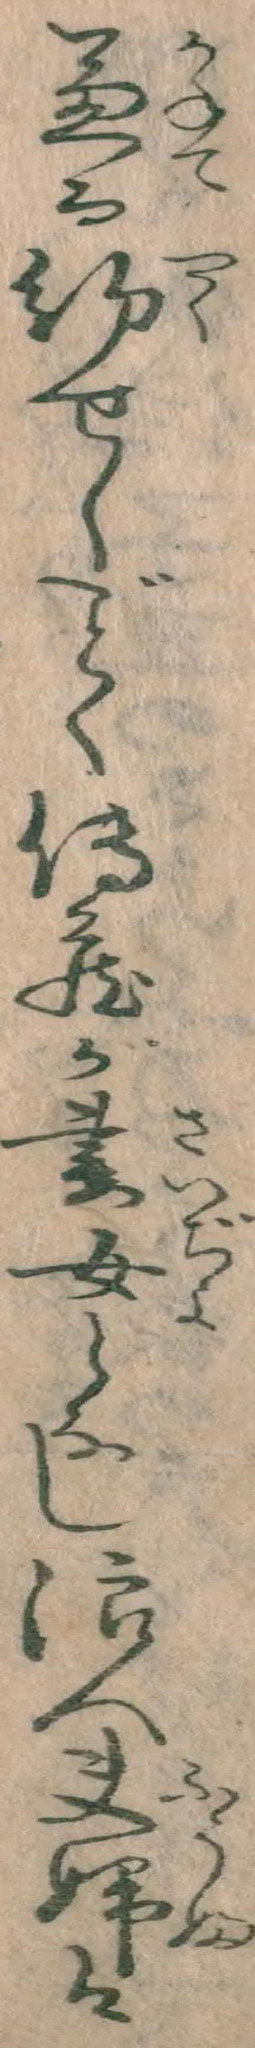兼而約せしごとく伝蔵が妻女となし浪人夫婦は
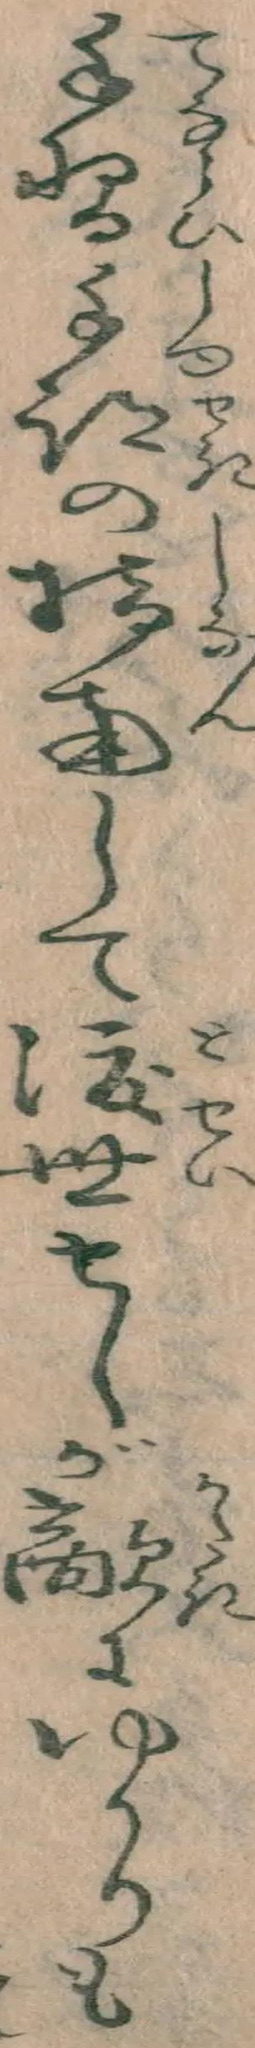手習手跡の指南して渡世せしが敵にゆかりも
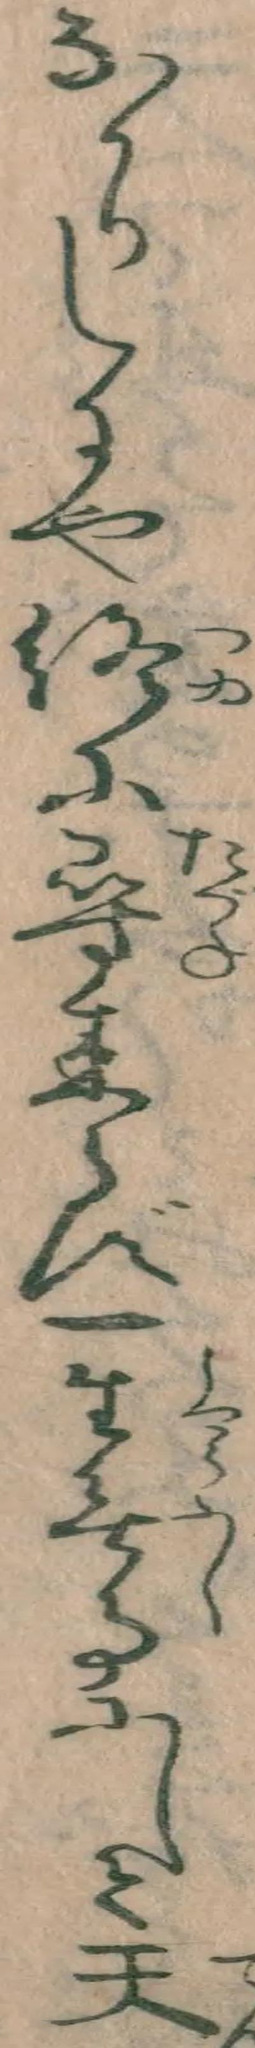なかりしにや終に尋来らず一生無事にして天
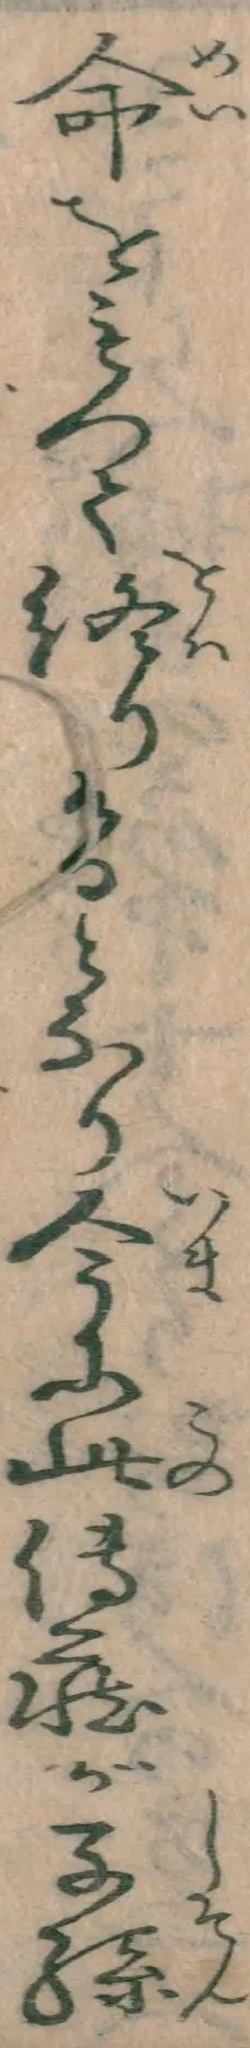命をもつて終りけるとなり今に此伝蔵が子孫
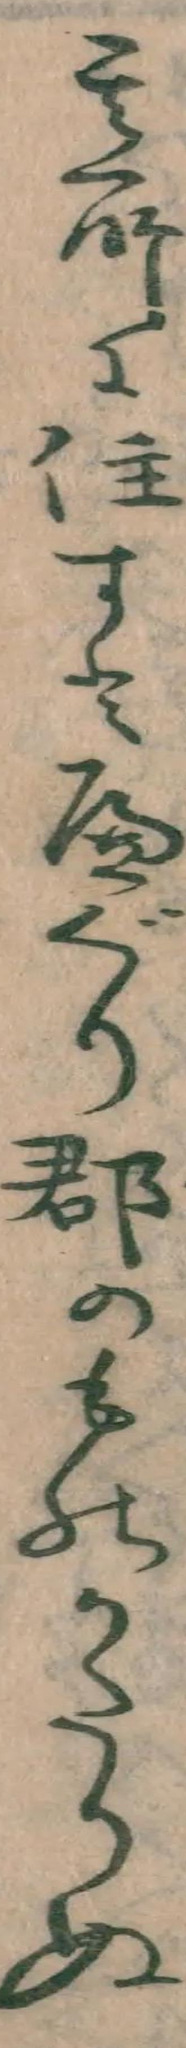其所に住すとへぐり郡のものかたりぬ
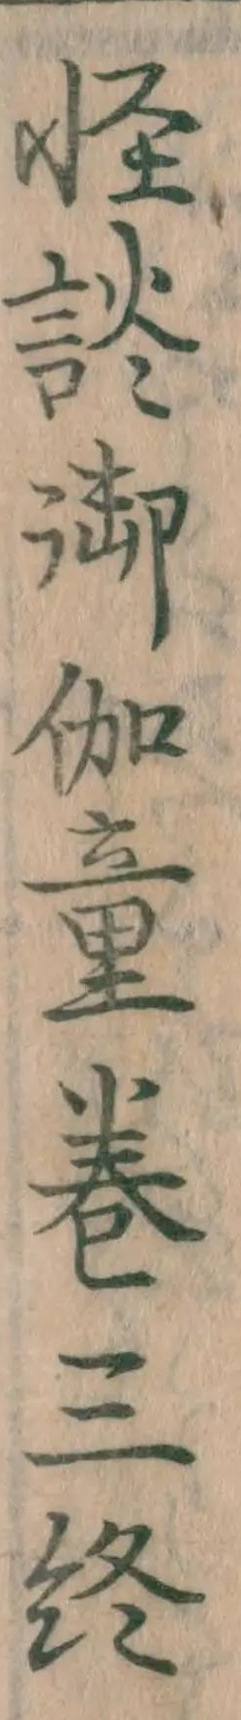怪談御伽童巻三終
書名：怪談御伽童 5巻. [2]
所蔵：国立国会図書館 National Diet Library, JAPAN
